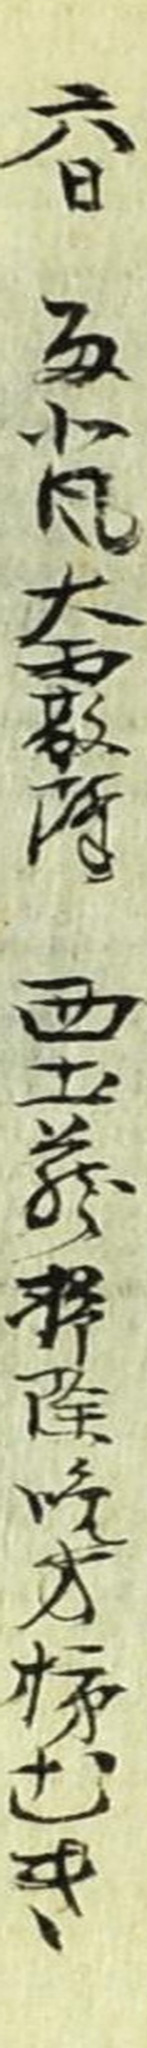六日雨北風大霰降西土蔵掃除晩方柿むき
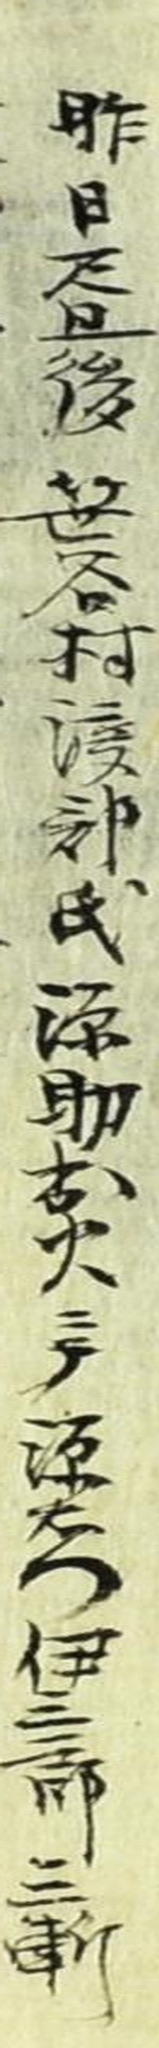昨夜昼後笹谷村渡部氏源助出火ニテ源右衛門伊三郎三斬
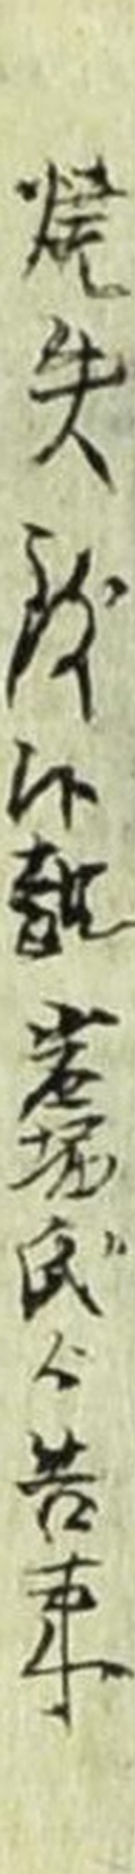消失致候趣岩堀氏ゟ告来
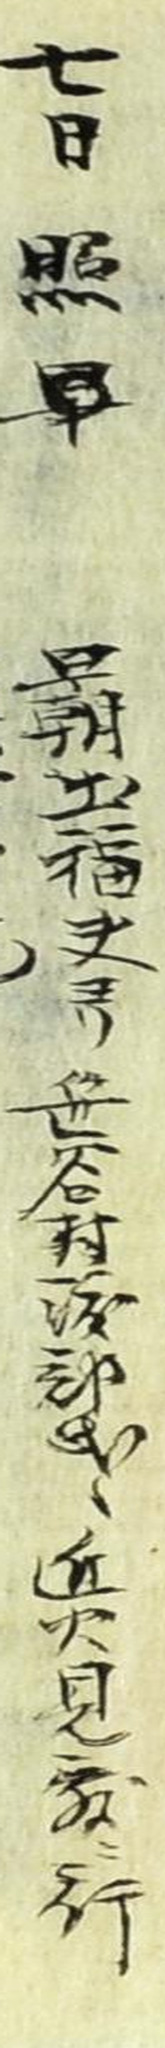七日照旱早朝出福夫ヨリ笹谷村渡部氏へ近火見舞ニ行
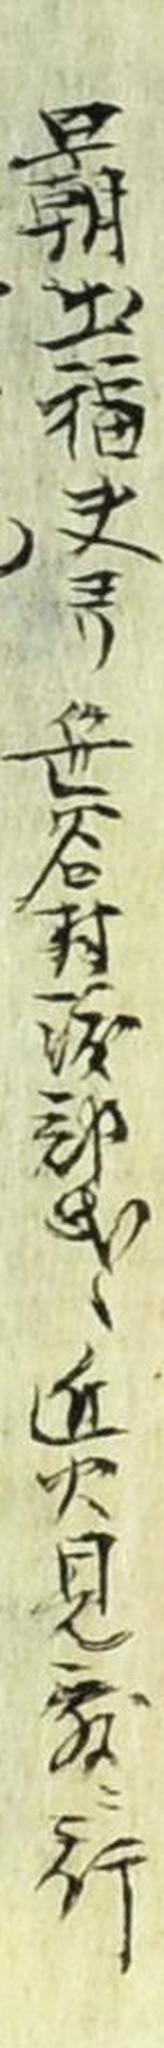七日照旱早朝出福夫ヨリ笹谷村渡部氏へ近火見舞ニ行
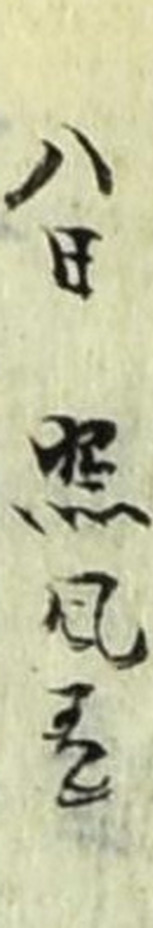八日照風有
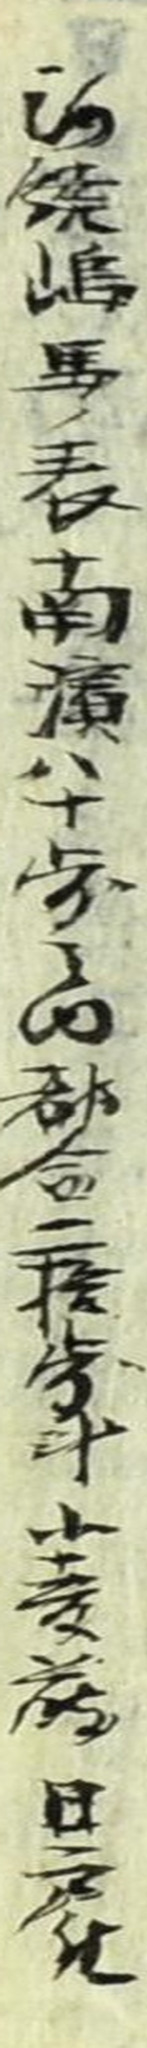河饒島馬ノ表南浜八十歩之内都合二拾歩計小麦蒔日雇

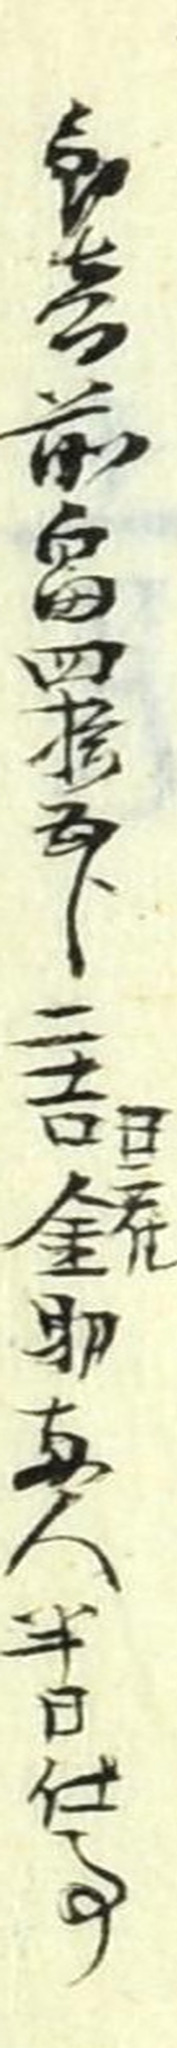勧音前畠四拾五歩二吉金助両人半日仕事
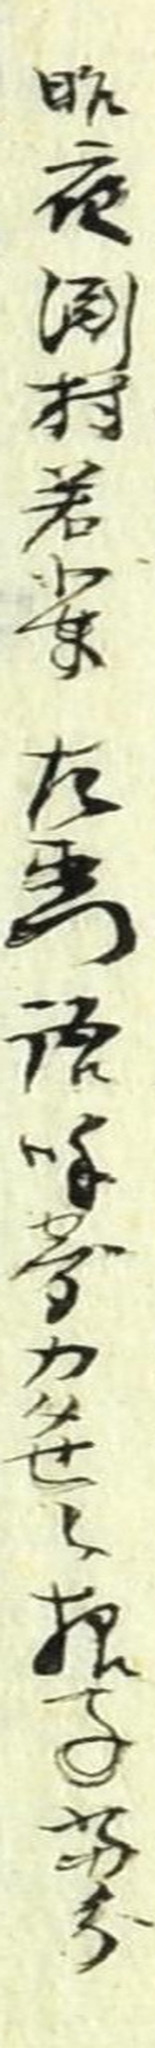昨夜淵村若輩左衛門語呼寄カタセ候様子当分
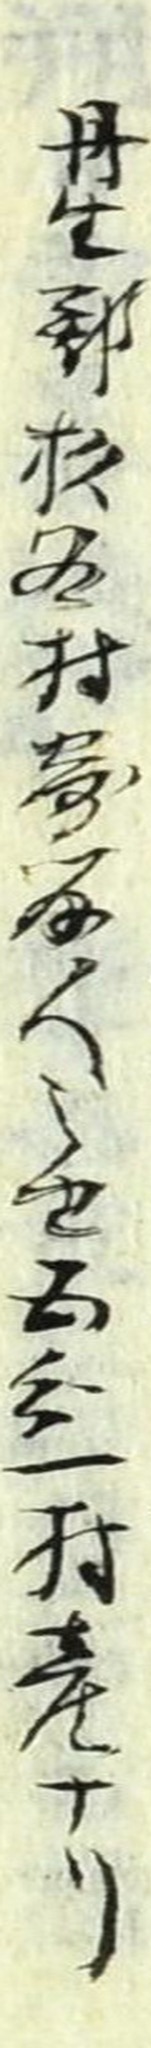丹生郡杉谷村寄留人之由五分一村産ナリ
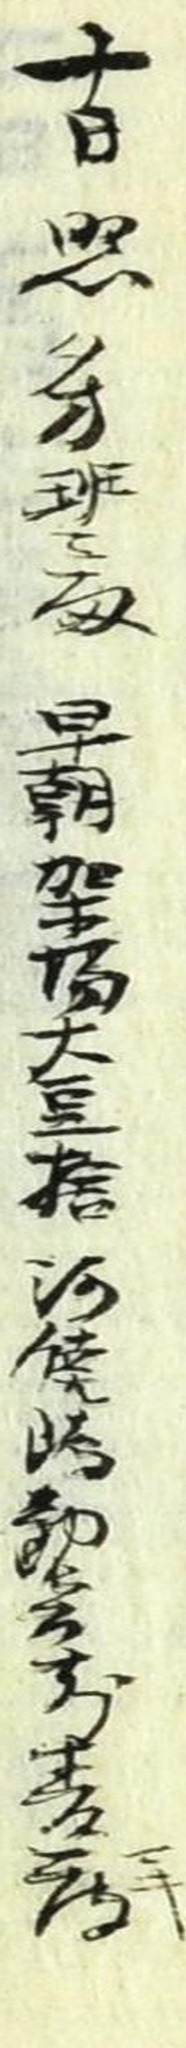十日照夕方班々雨早朝架場大豆捨河饒島勧音前麦蒔
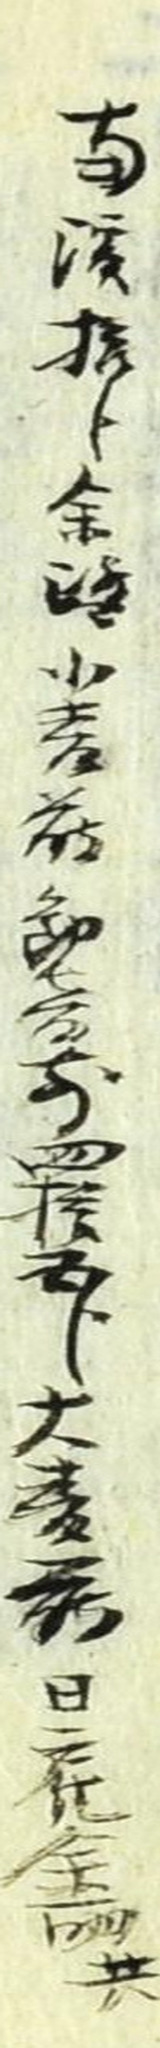南浜拾歩余跡小麦蒔勧音前四拾五歩大麦蒔日雇金助共
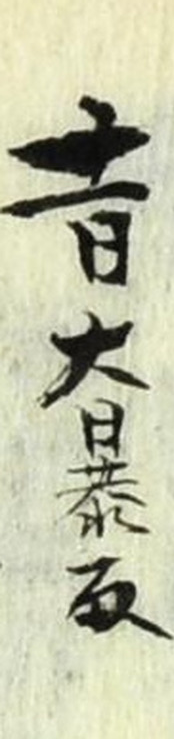十一日大暴雨
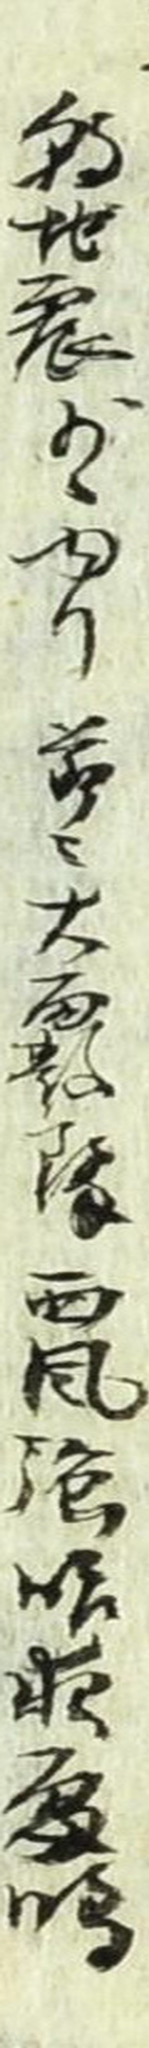朝地震少々ゆり節々大霰降西風強昨夜雷鳴
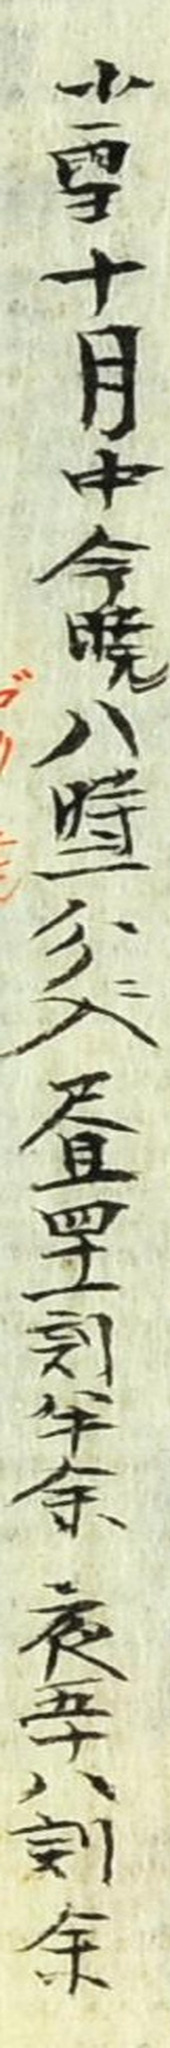小雪十月中今暁八時二分ニ入昼四十一刻半余夜五十八刻半余
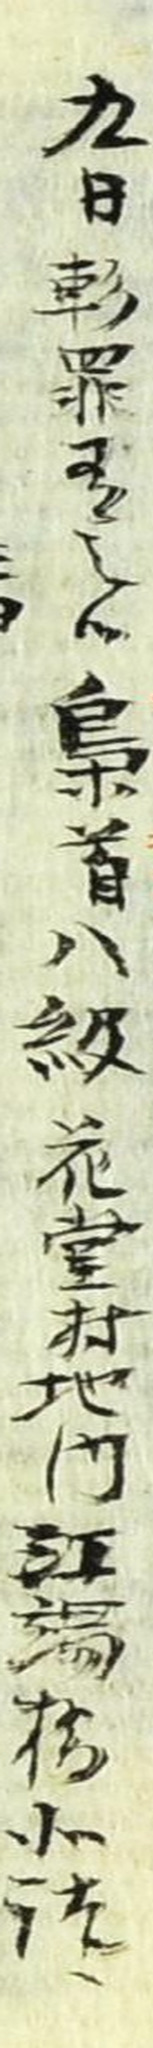九日斬罪有之候梟首八級花堂村地内江端橋北詰へ
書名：（日記）
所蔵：福井県文書館 Fukui Prefectural Archives
